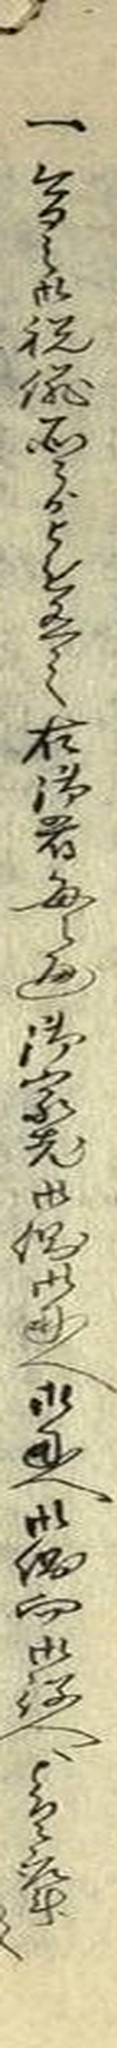一今日之御祝儀所々ゟ被進有之右御肴毎之通御家老御側御用人御用人御側向御役人へ被下ニ取計之
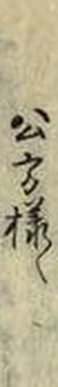公方様へ
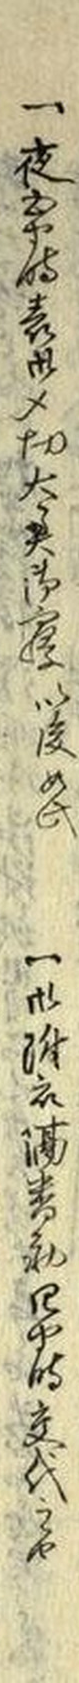一夜五半時表御〆切大奥御寝以後如此一御附衆隔番勤四半時交代ニ候由
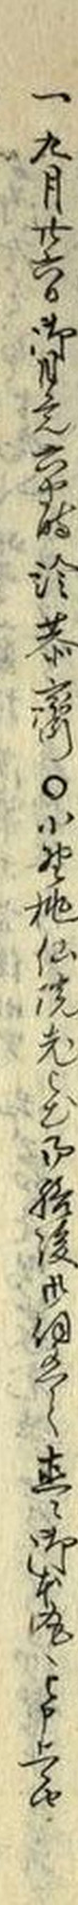一九月廿六日御目覚六半時診恭斉〇小野桃仙院老被出御膳後御伺有之直ニ御本丸へ被申上候由
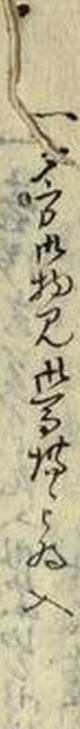一夕方御物見御馬場へ被為入
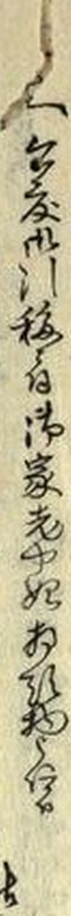一此度御引移ニ付御家老中始拝領物被仰付
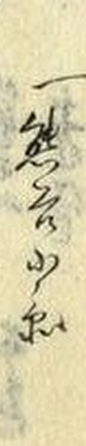熊谷小兵衛
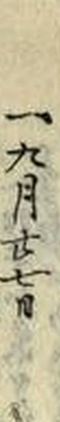一九月廿七日
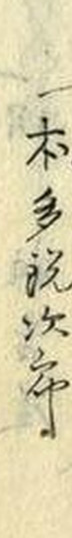本多鋭次郎
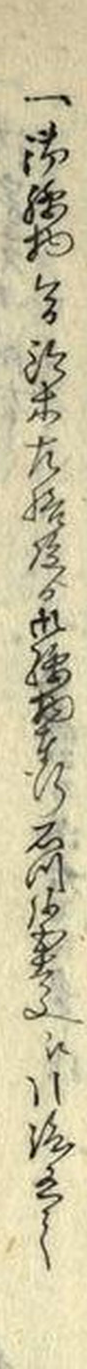一御腰物今日鈴木左膳殿ゟ御腰物奉行石川弥五大夫江引渡有之
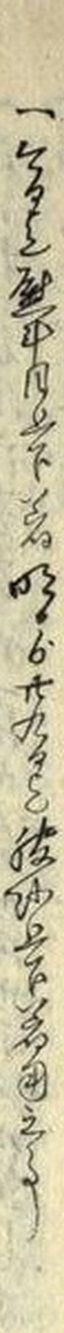一今日迄熨斗目上下着明日ゟ廿九日迄服沙上下着用之事
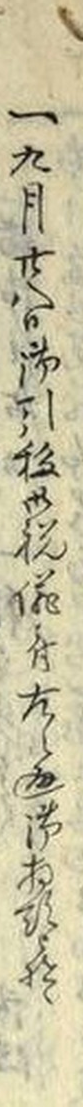一九月廿八日御引移御祝儀ニ付左之通御拝領被遊候
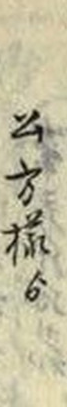公方様へ

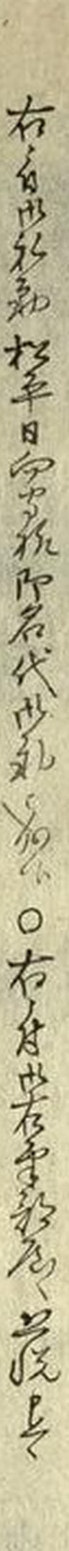右ニ付御礼勤松平日向守様御名代御礼被成候〇右ニ付御右筆部屋へ恐悦申上候
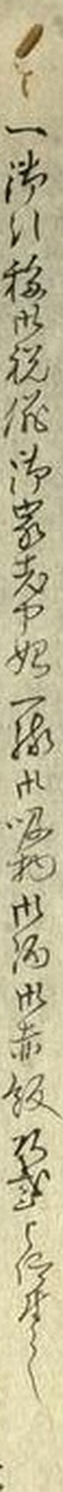一御引移御祝儀御家老中始一縁御吸物御酒御赤飯頂戴被仰付之
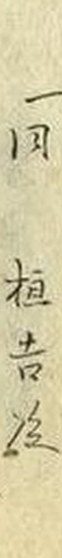同桓吉殿
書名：少傅日録抄（斉善付側向頭取日記、在府）
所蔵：福井県文書館 Fukui Prefectural Archives
